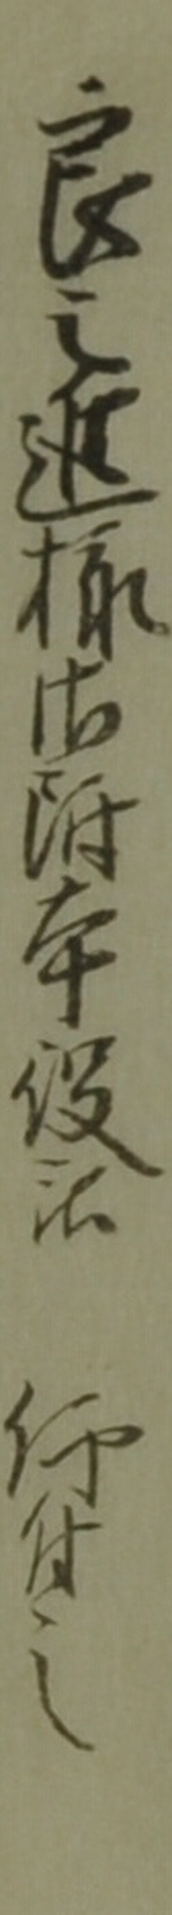良之進様御附本役被仰付之
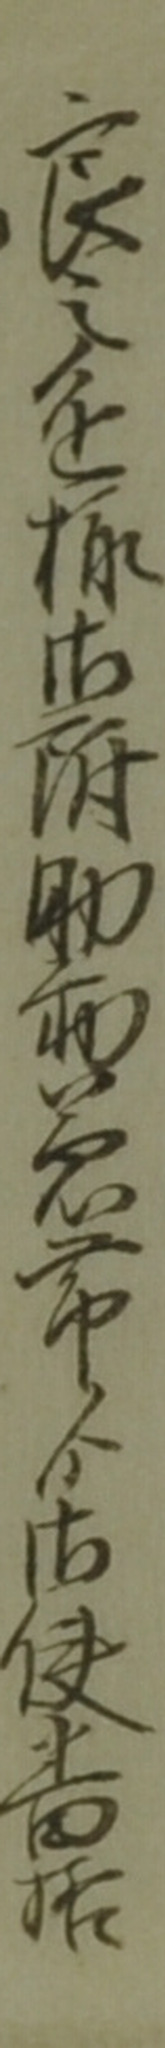良之進様御附助勤兼帯ゟ御使番格
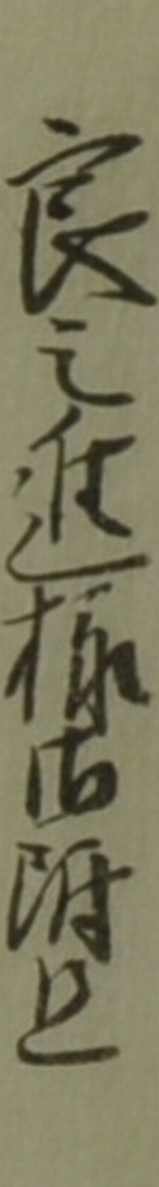良之進様御附被
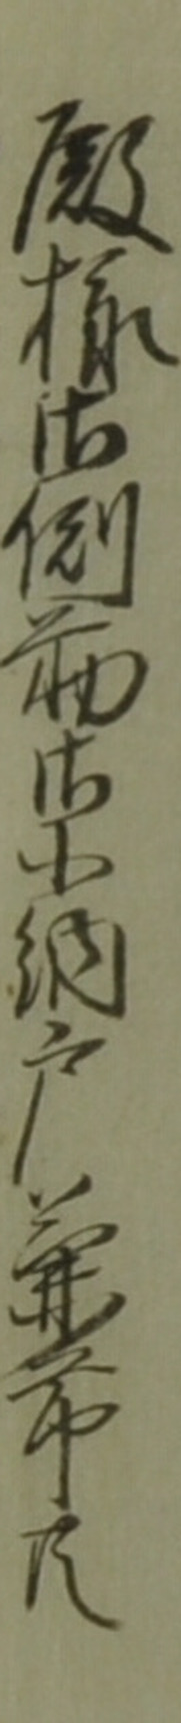殿様御側勤御小納戸兼帯共
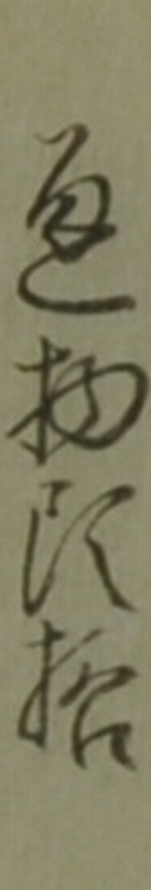通物頭格
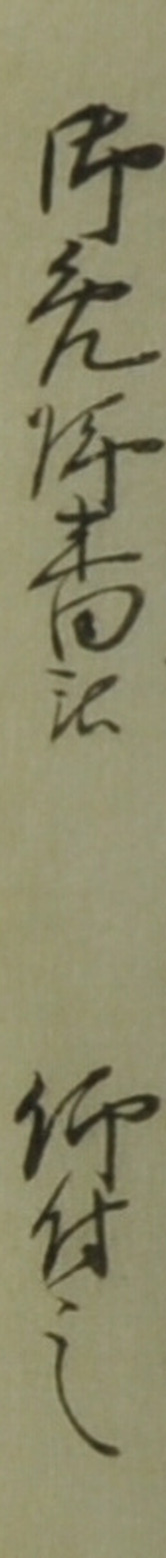御免帰番被仰付之

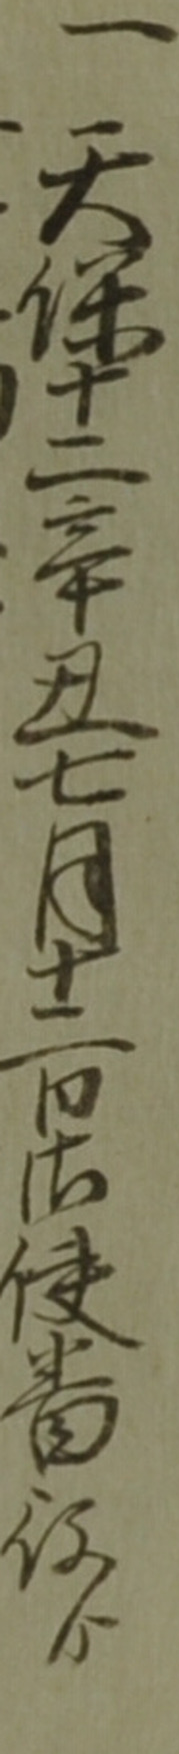一天保十二辛丑七月十二日御使番役ゟ
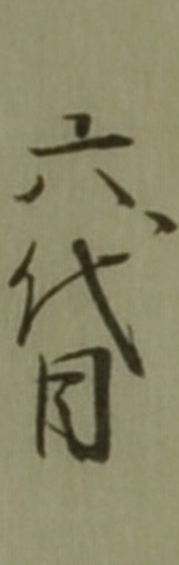六代目
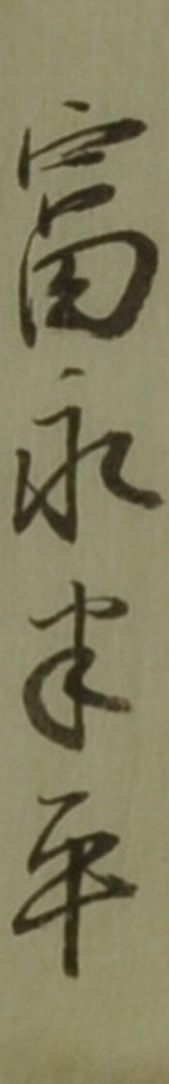富永半平
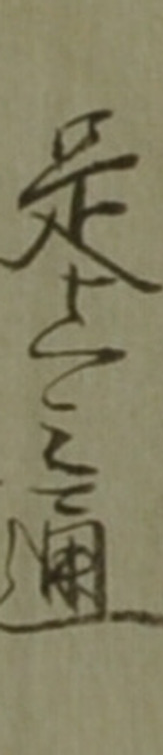是迄之通
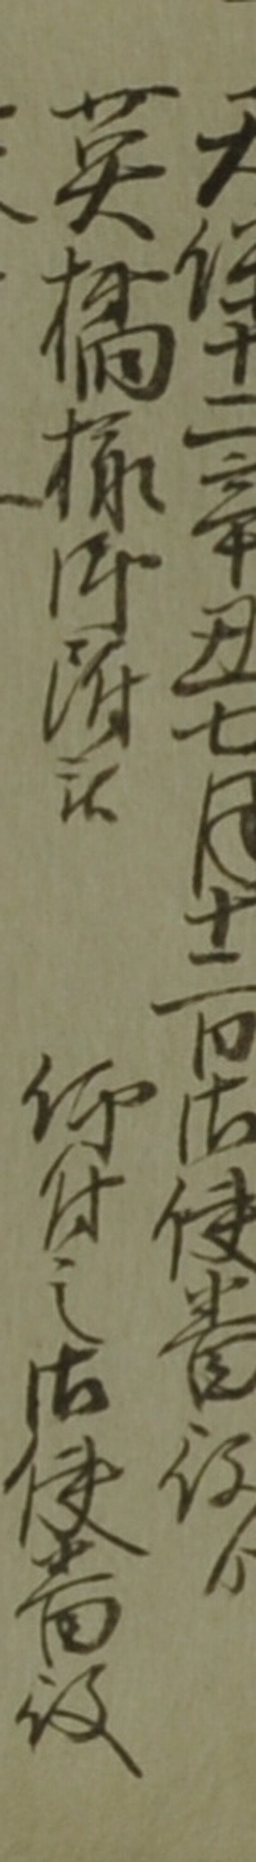英橘様御附被仰付之御使番役
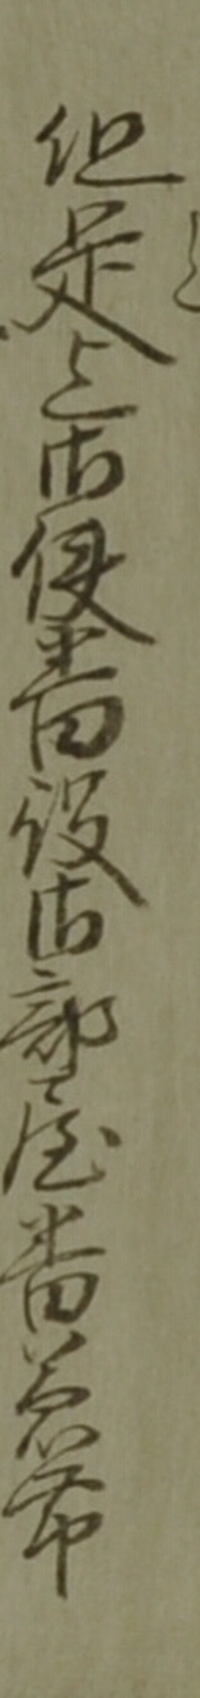但是迄御使番役御部屋番兼帯
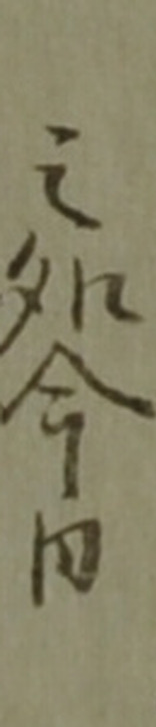之処今日
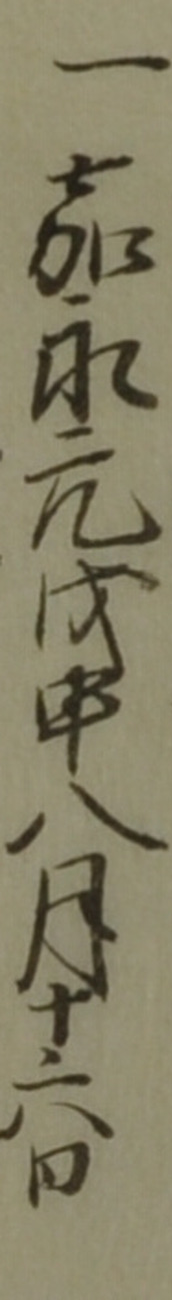一嘉永元戊申八月十六日
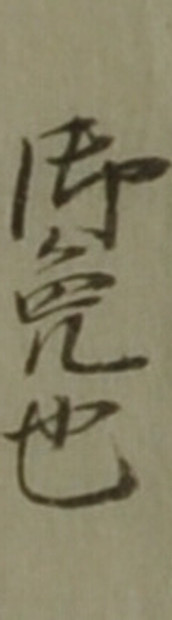御免也
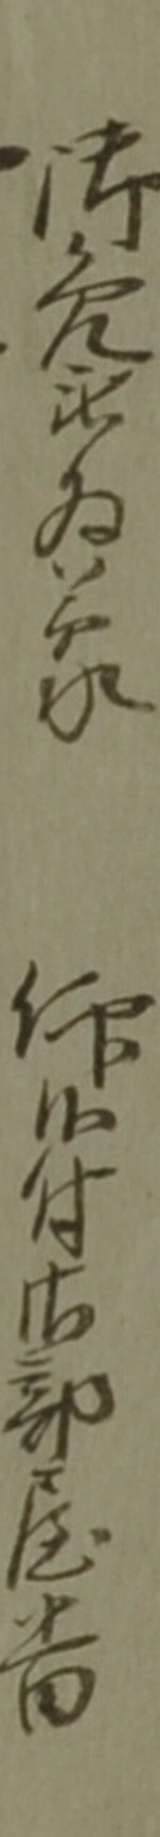御免被為我仰候付御部屋番
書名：諸御役代々録（六）
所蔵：伊那市立高遠町図書館・合同会社AMANE
